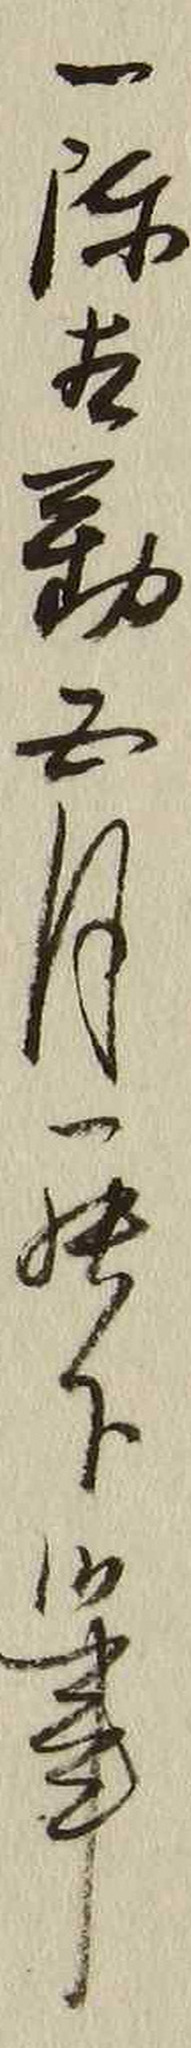一陣相勤五月罷下候事
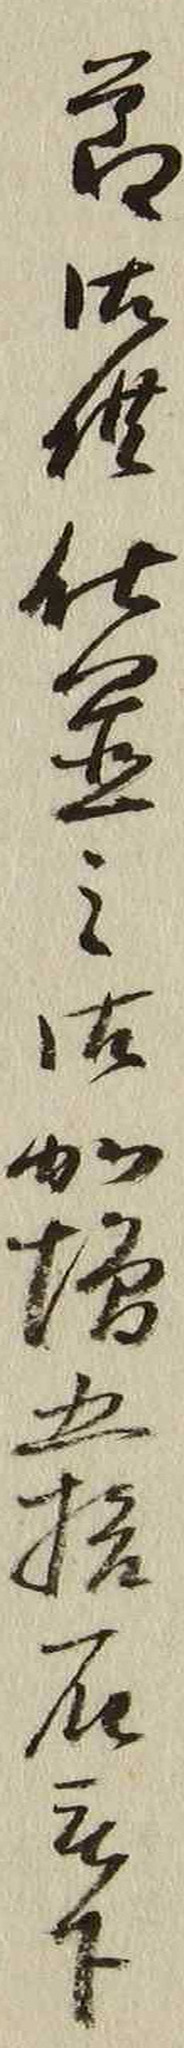節御供仕並之御加増五拾石被下
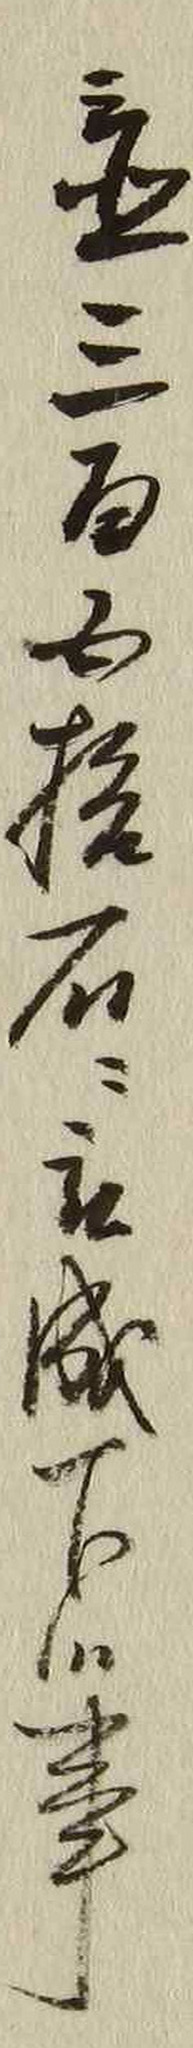置三百五拾石ニ被成下候事
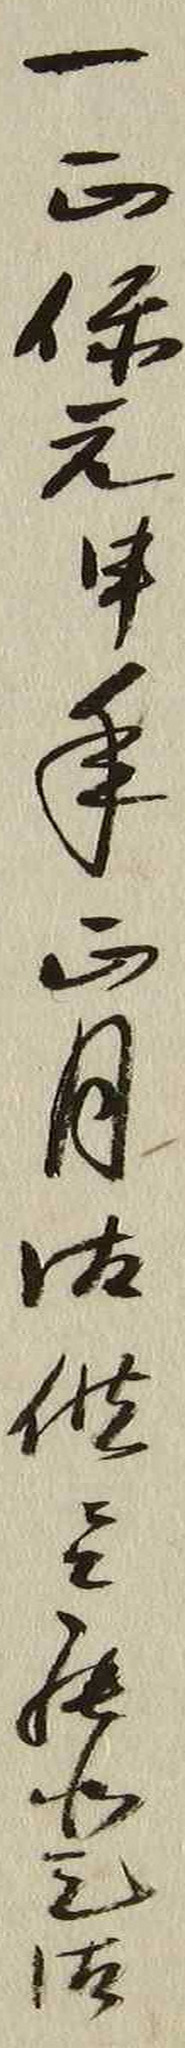一正保元申年正月御供ニ而罷登御
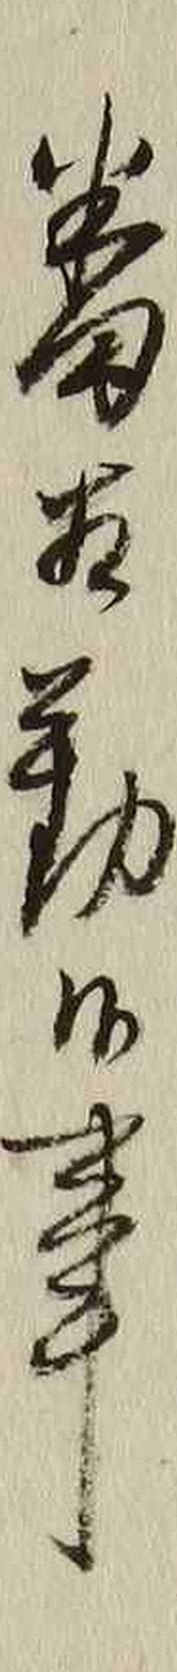番相勤候事
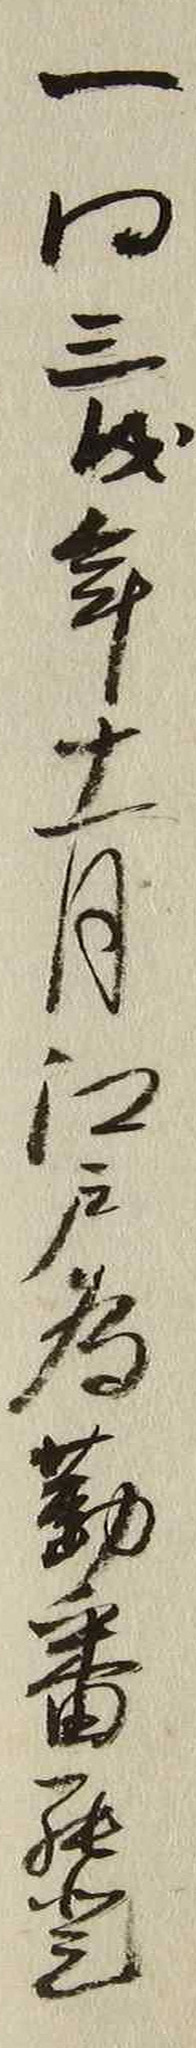一同三戌年十一月江戸為勤番罷登
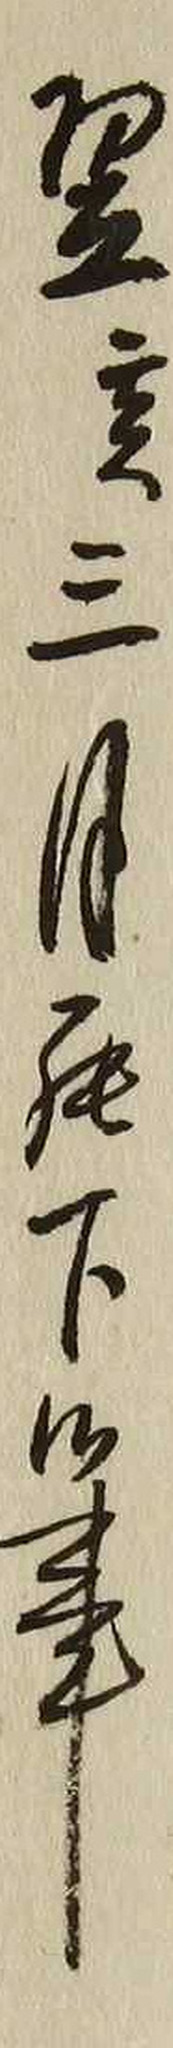翌亥三月罷下候事
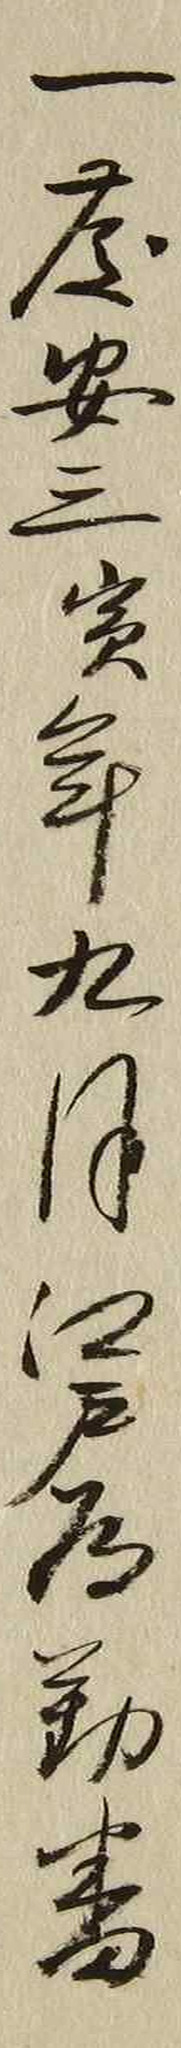一慶安三寅年九月江戸為勤番
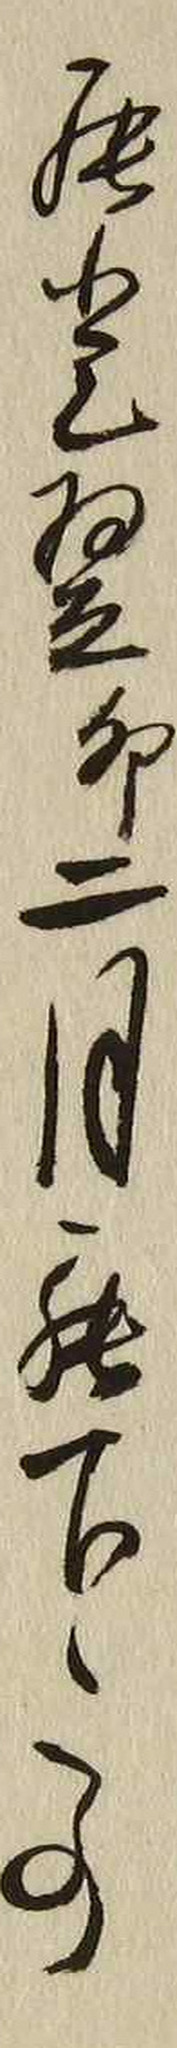罷登翌卯二月罷下候事
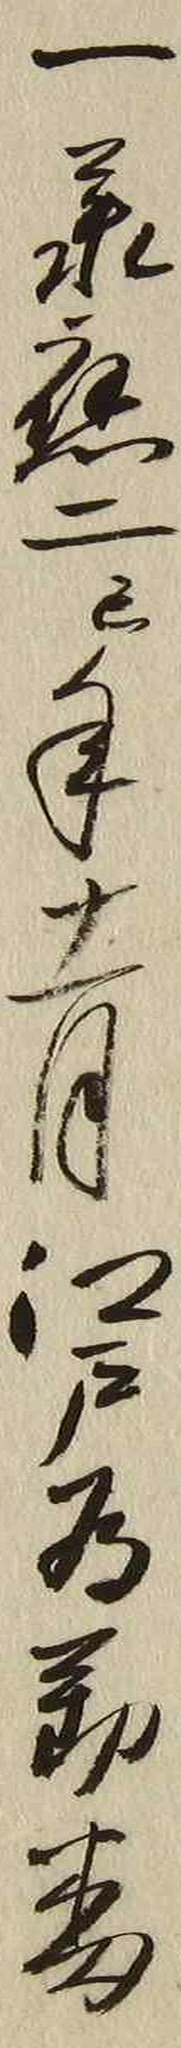一承応二巳年十一月江戸為勤番
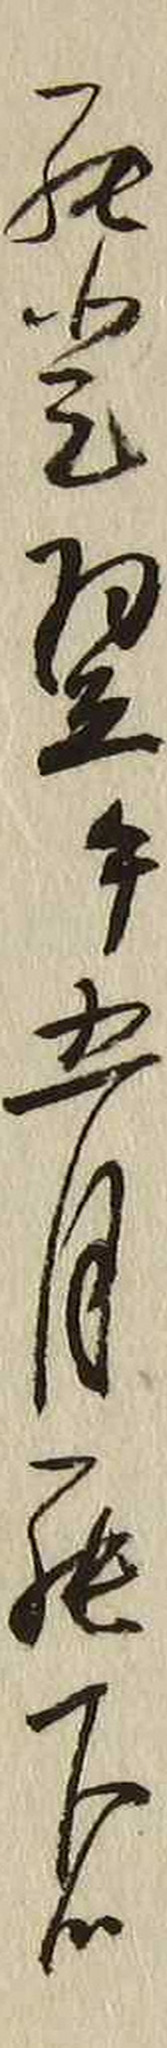罷登翌午五月罷下候
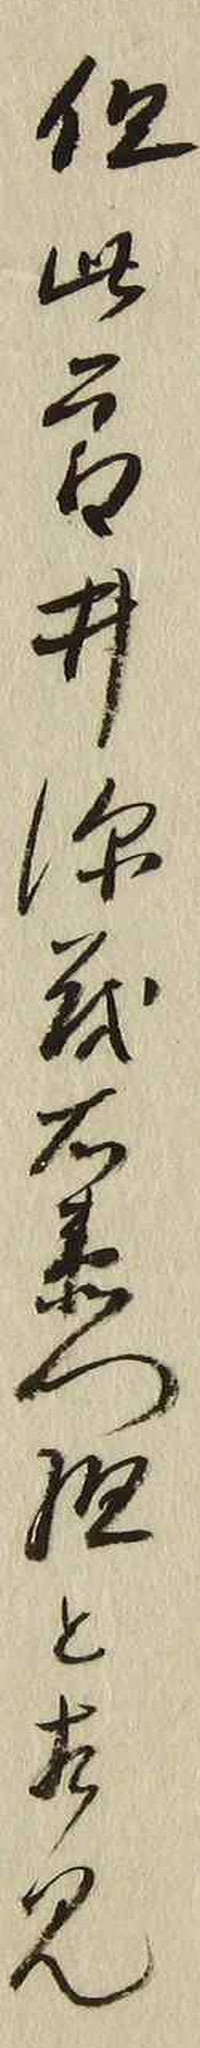但此節井深茂右衛門組と相見
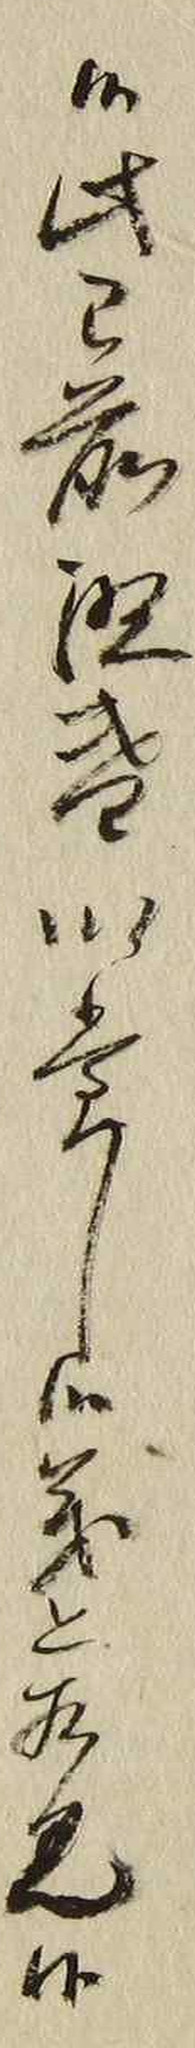候此已前組替いたし候義と相見候
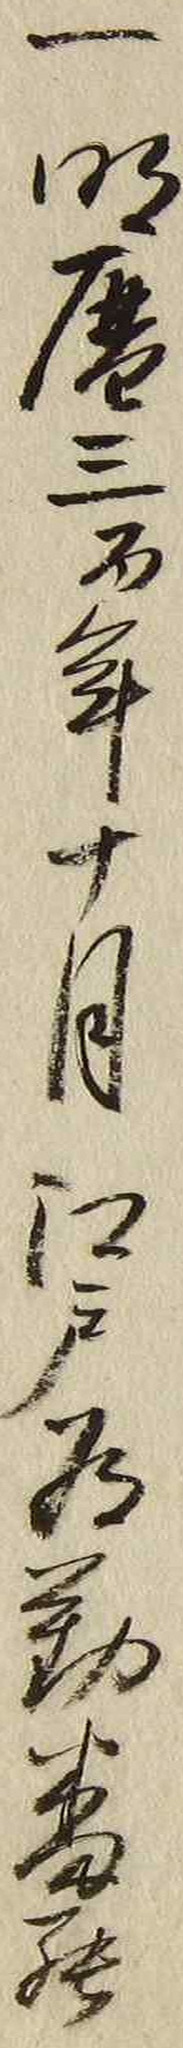一明暦三酉年十月江戸為勤番罷
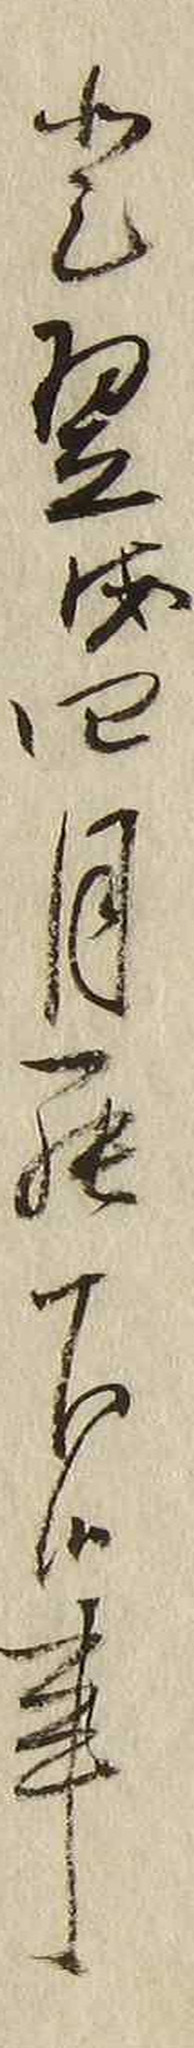登翌戌四月罷下候事
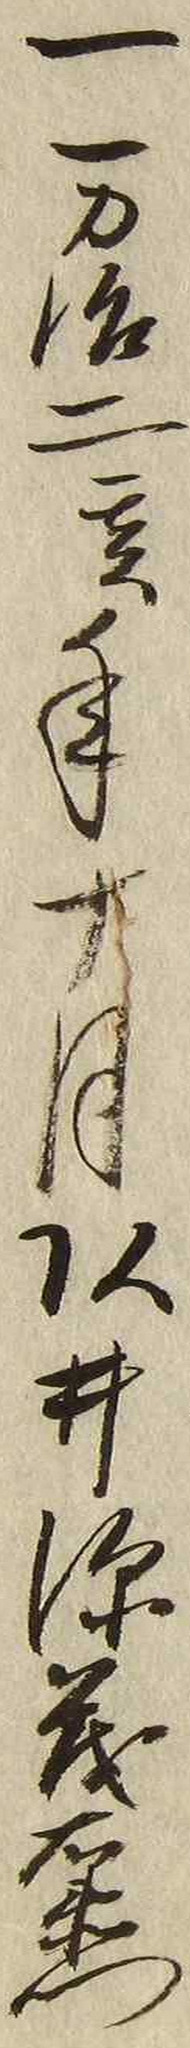一万治二亥年十月頭井深茂右衛門
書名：諸士系譜　巻之356　す之部6
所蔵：会津若松市立会津図書館
